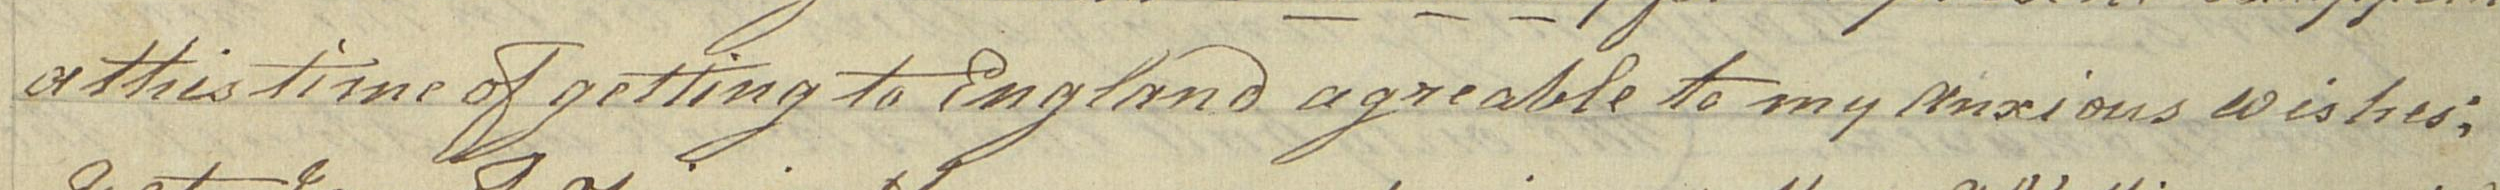a this time of getting to England agreable to my anxious Wishes;
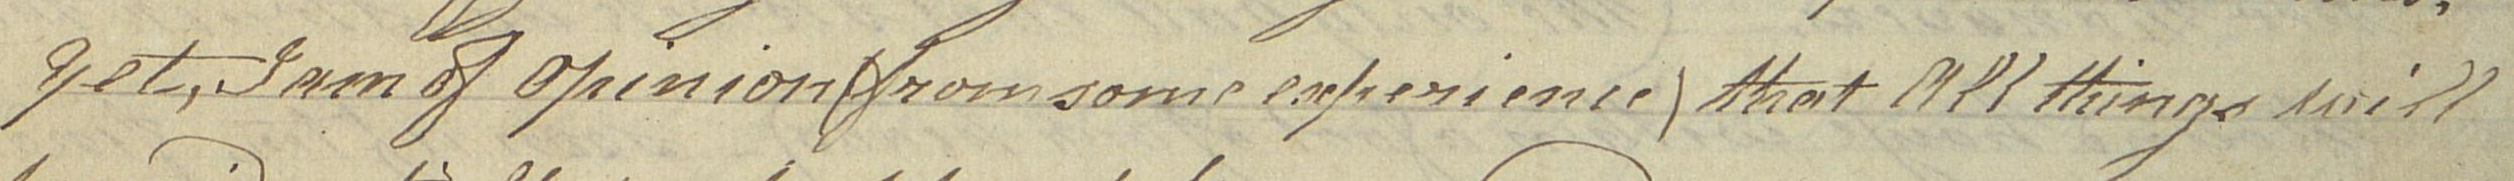yet, I am of Opinion from some experience) that All things will
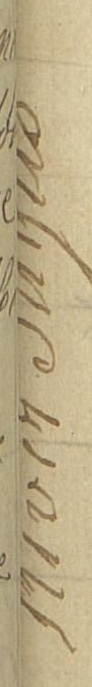River [_____]
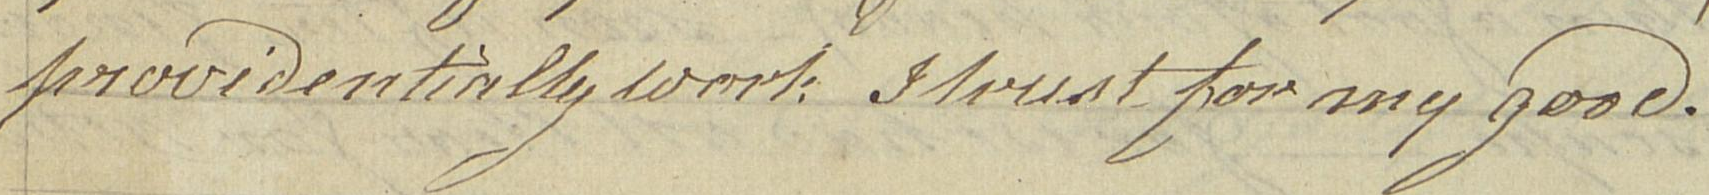providentially work I trust for my good.
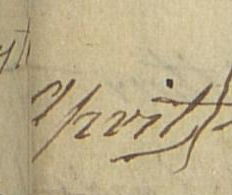-prit
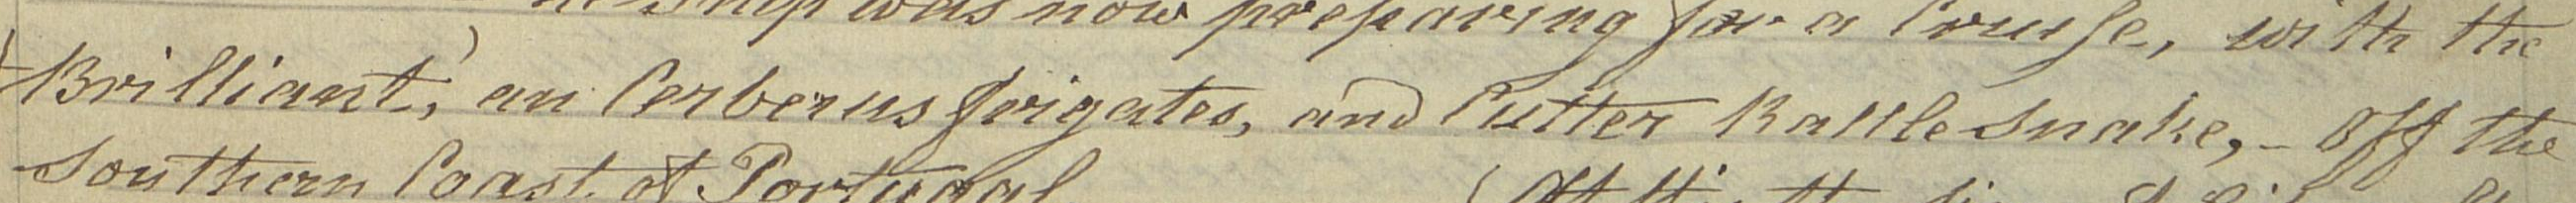Brilliant, an Cerberus frigates, and Cutter Rattle Snake, Off the
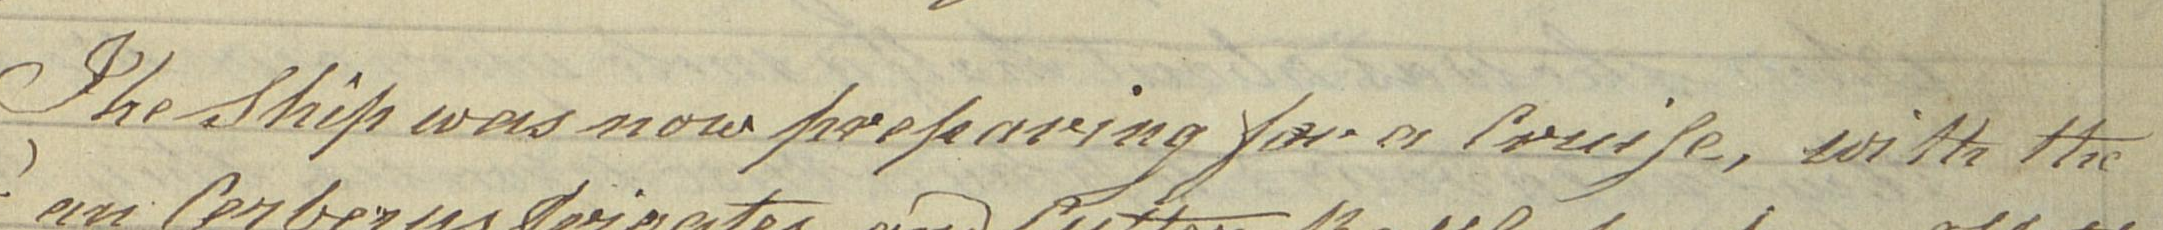The Ship was now preparing for a Cruise, with the
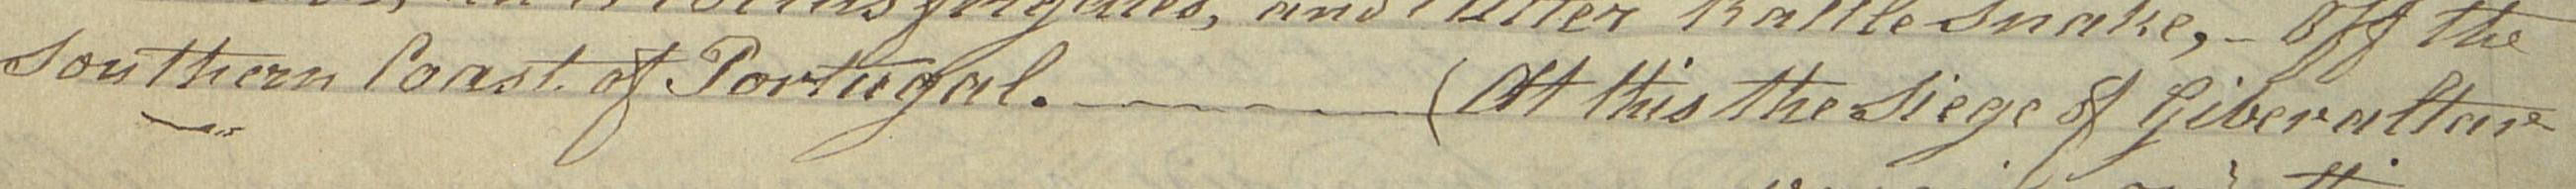Southern Coast of Portugal. (At this the Siege of Giberaltar
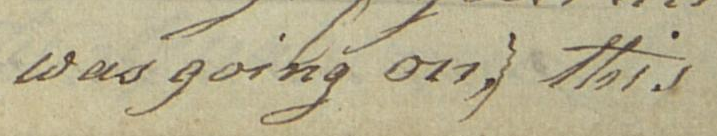was going on,) this
